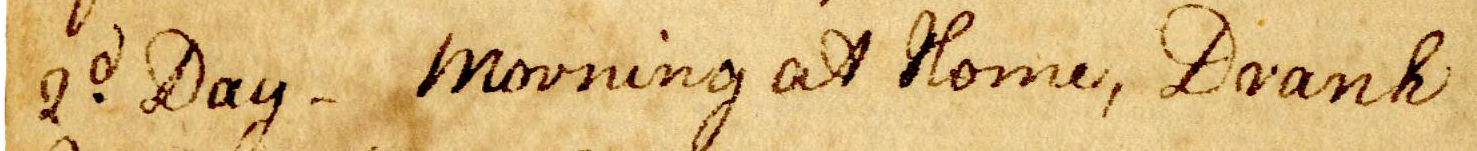2^d. Day- Morning at Home, Drank
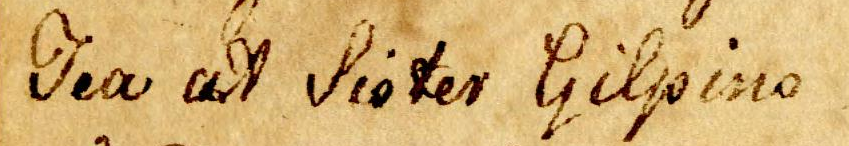Tea at Sister Gilpins
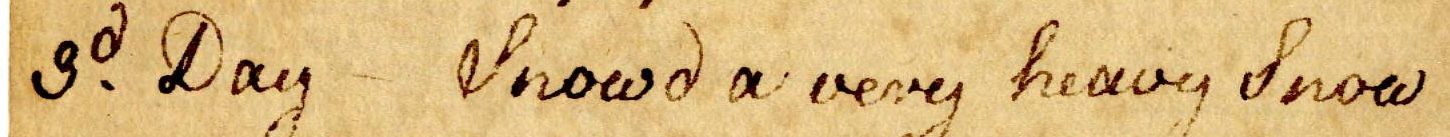3^d. Day- Snowd a very heavy Snow
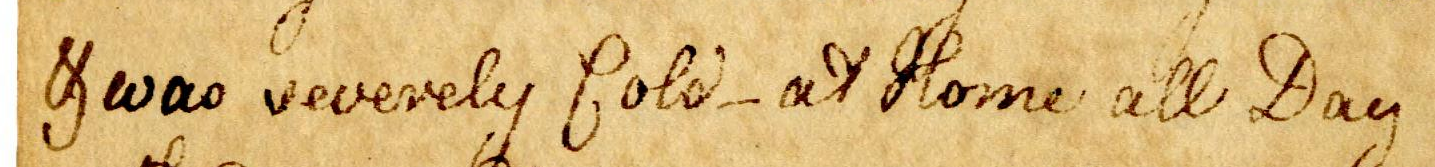& was severely Cold- at Home all Day
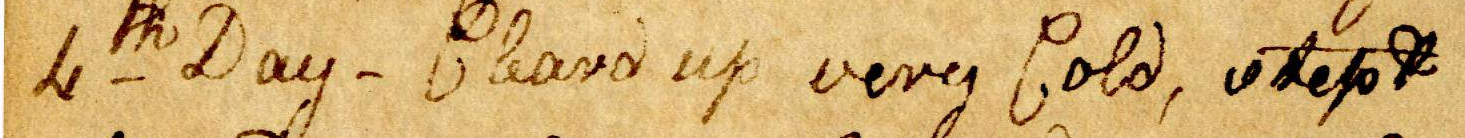4^th Day- Cleard up very Cold, stept
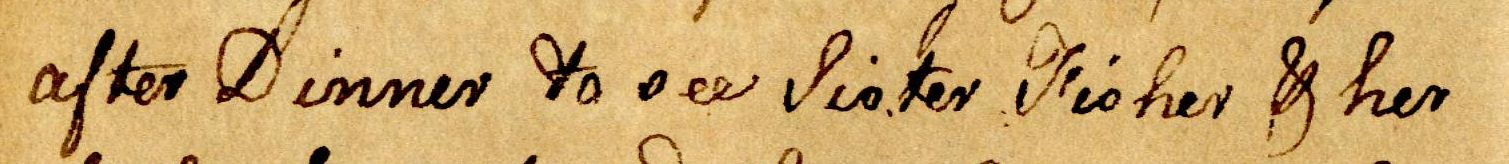after Dinner to see Sister Fisher & her
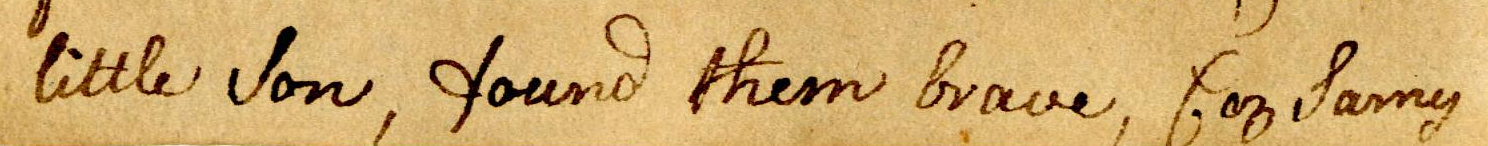little Son, found them brave, Coz Samy
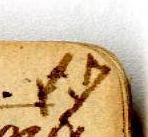17
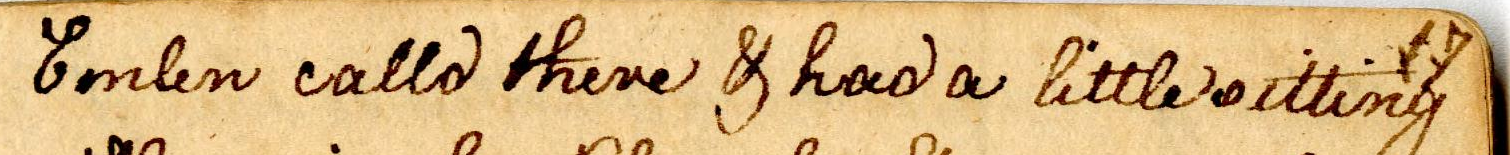Emlen calld there & had a little sitting
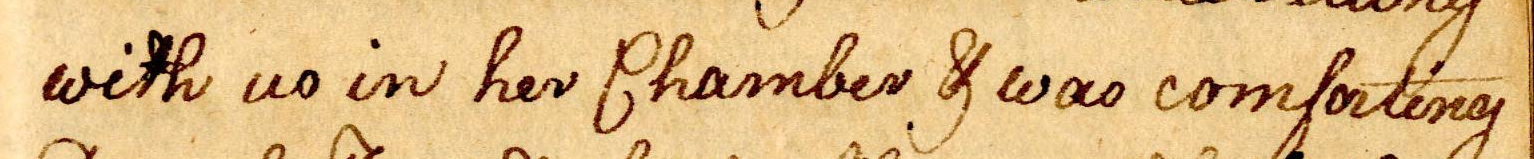with us in her Chamber & was comforting
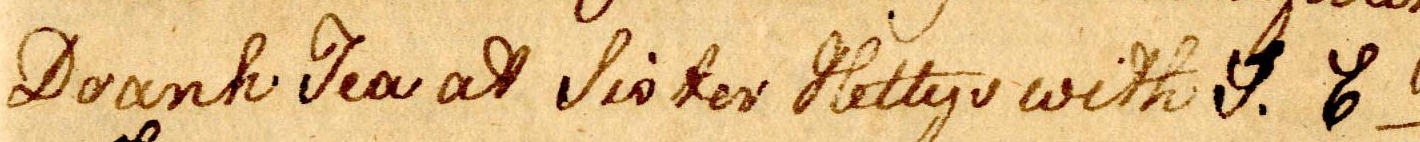Drank Tea at Sister Hettys with [J.] E
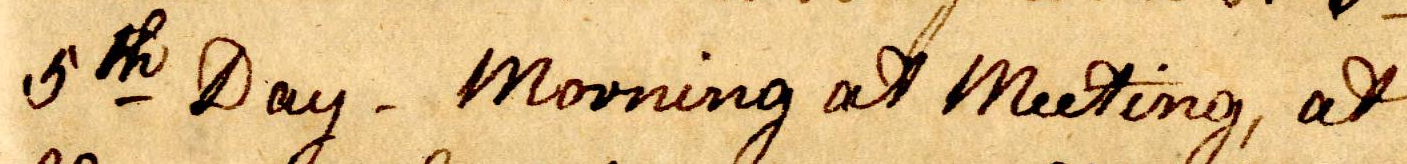5^th Day- Morning at Meeting, at
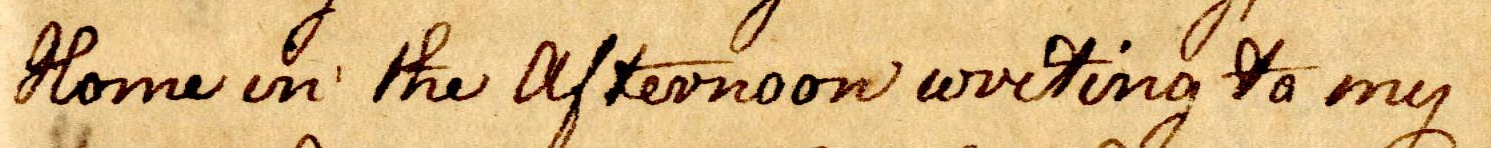Home in the Afternoon writing to my
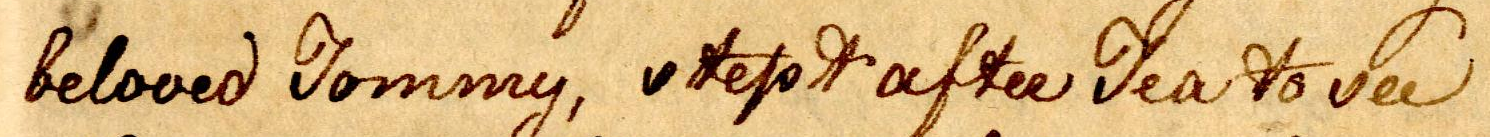beloved Tommy, stept after Tea to see
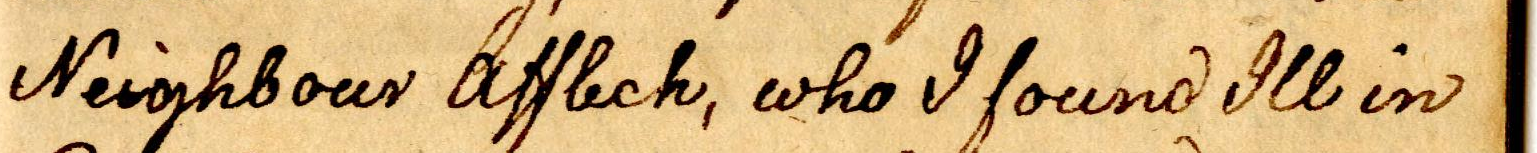Neighbour Affleck, who I found Ill in
